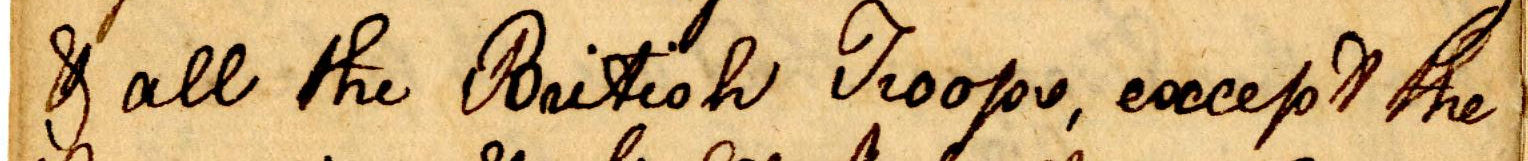& all the British Troops, except the
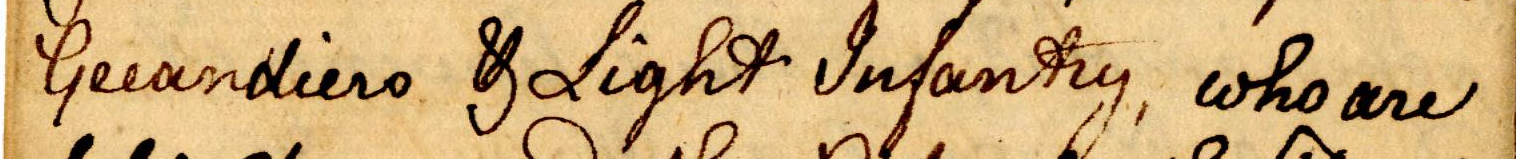Greandiers & Light Infantry, who are
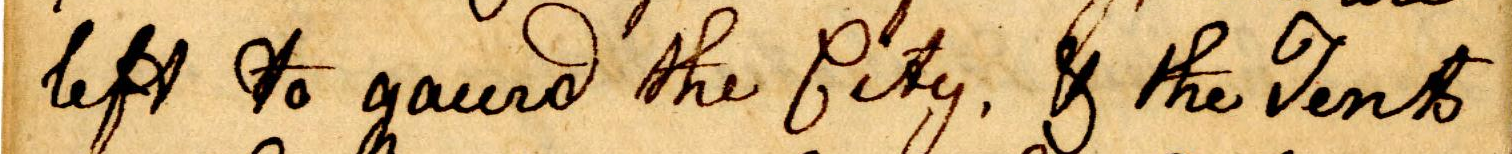left to gaurd the City, & the Tents
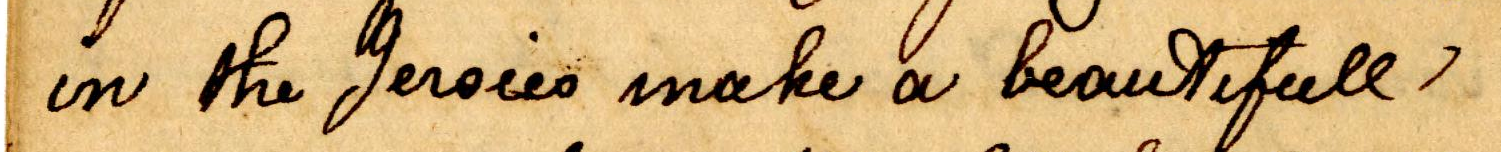in the Jersies make a beautifull
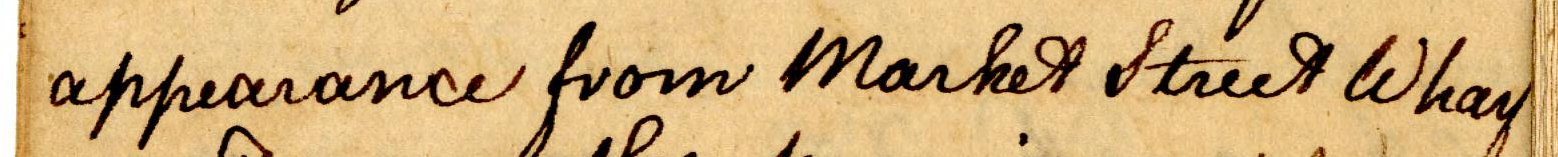appearance from Market Street Wharf
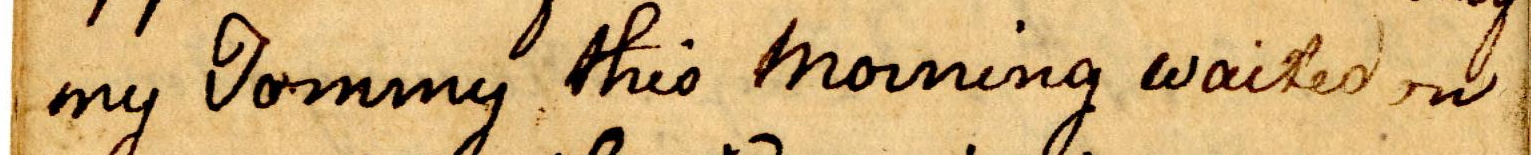my Tommy this Morning waited on
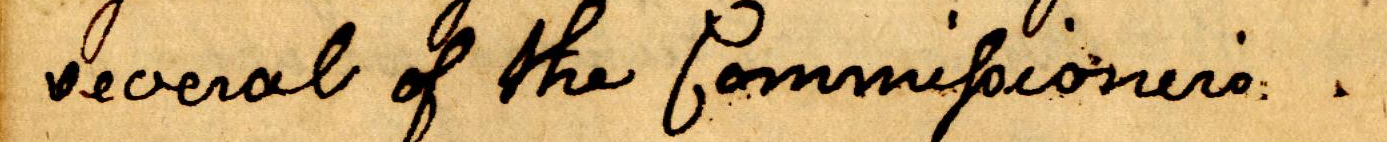several of the Commissioners
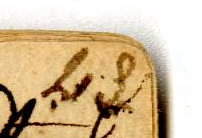43
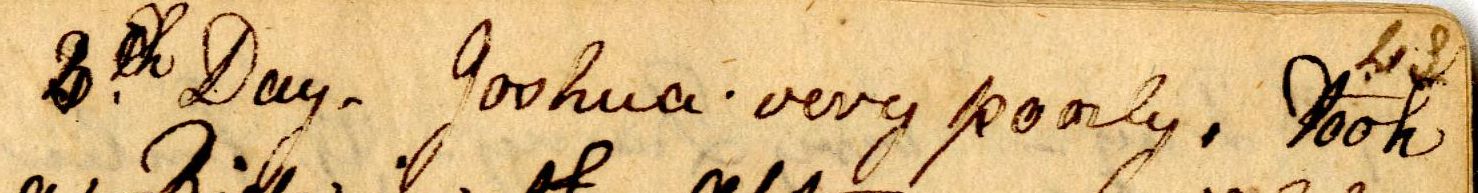3^th Day. Joshua very poorly, took
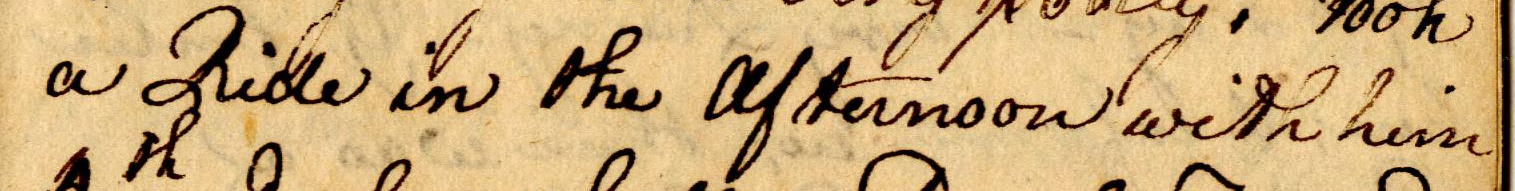a Ride in the Afternoon with him
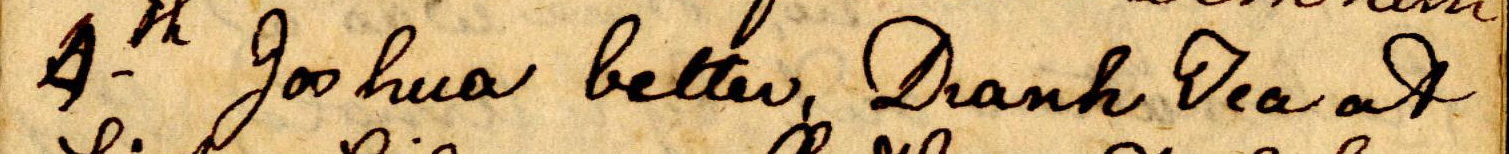4^th Joshua better, Drank Tea at
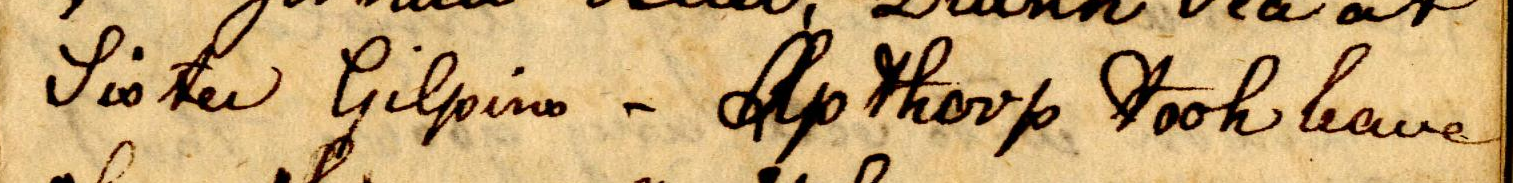Sister Gilpins- Apthorp took leave
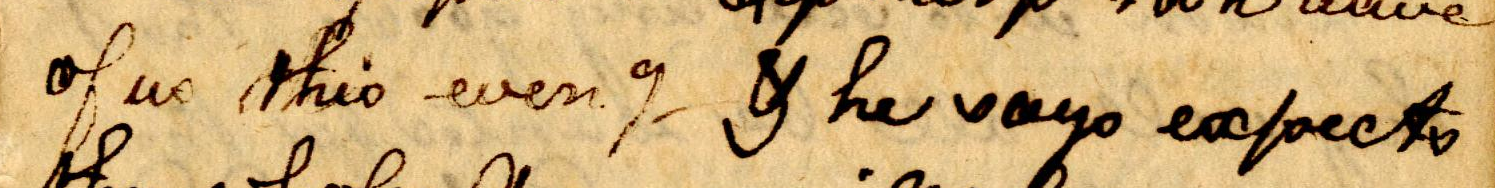of us this even^g & he says expects
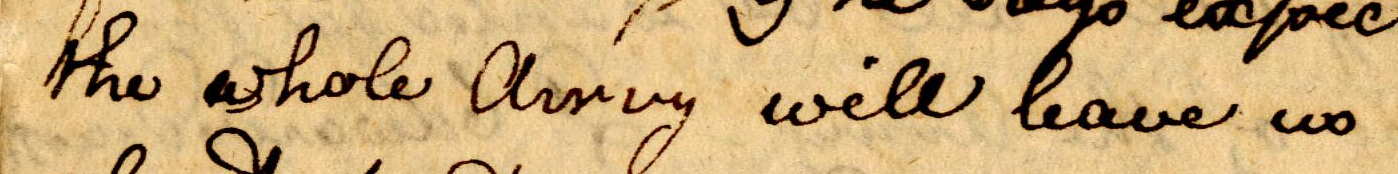the whole Army will leave us
